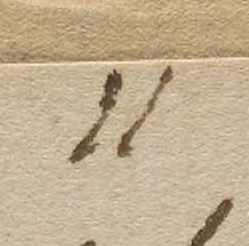11
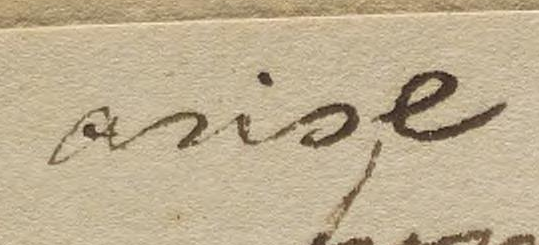arise
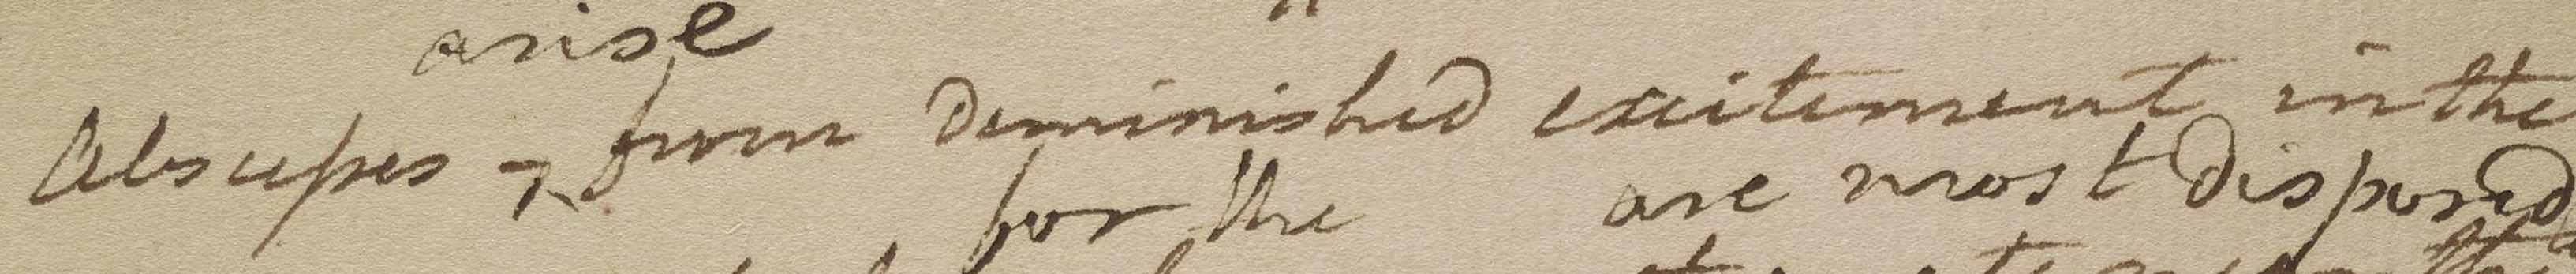Abscesses ^ from diminished excitement in the
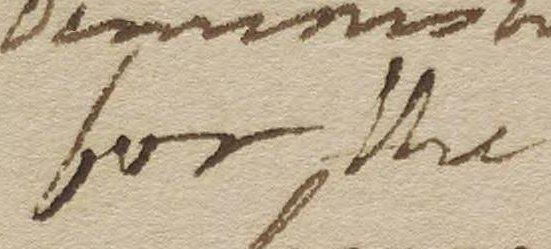for the
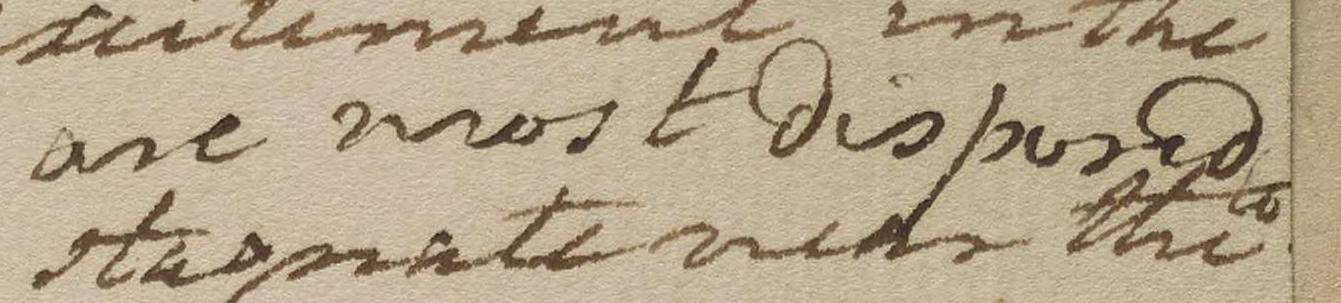are most disposed to
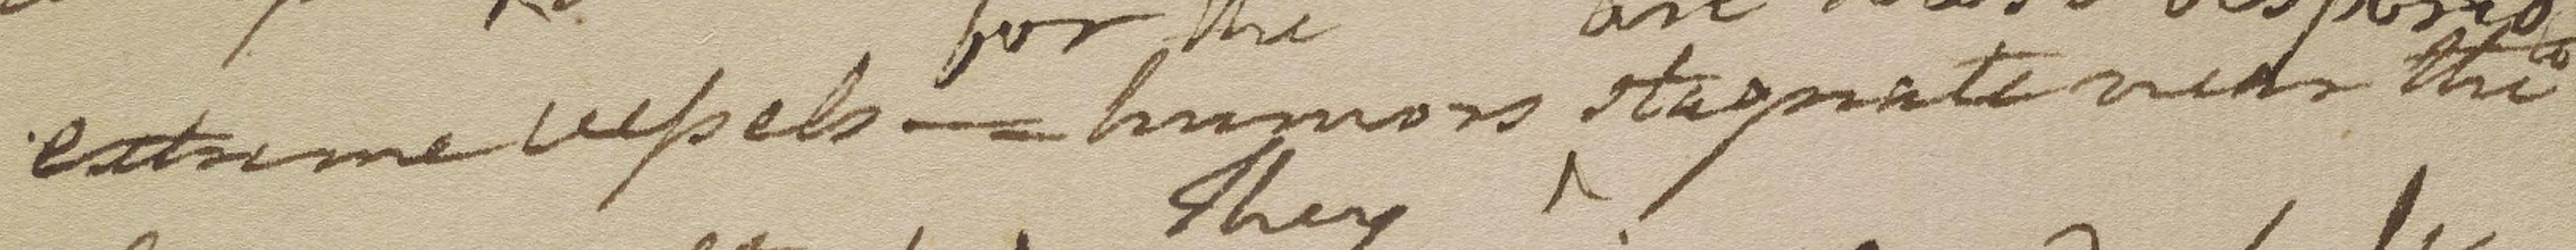extreme vessels- humors ^ stagnate near the
